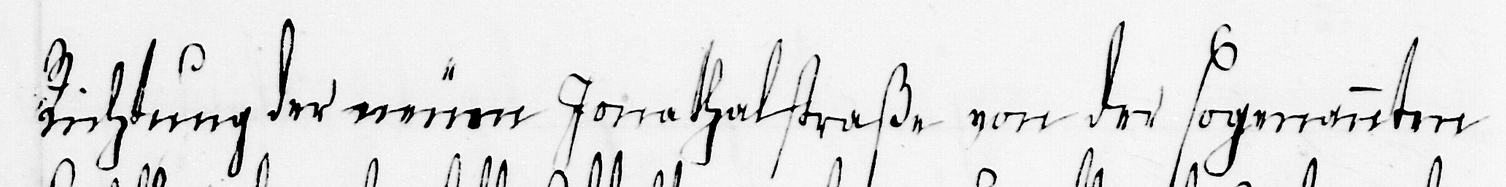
Richtung der neuen Jonathalstraße von der sogenannten
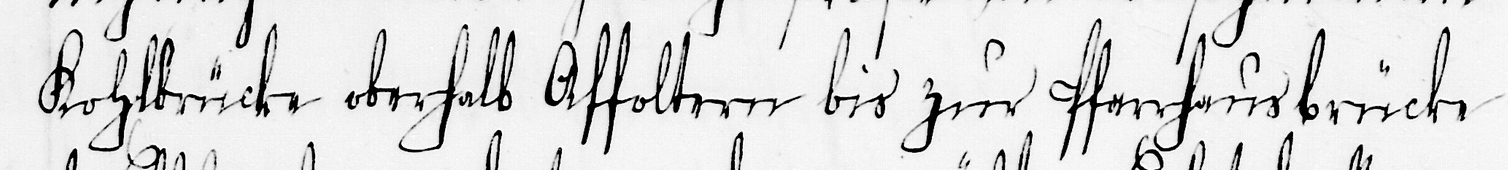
Kohlbrücke oberhalb Affoltern bis zur Pfarrhausbrücke
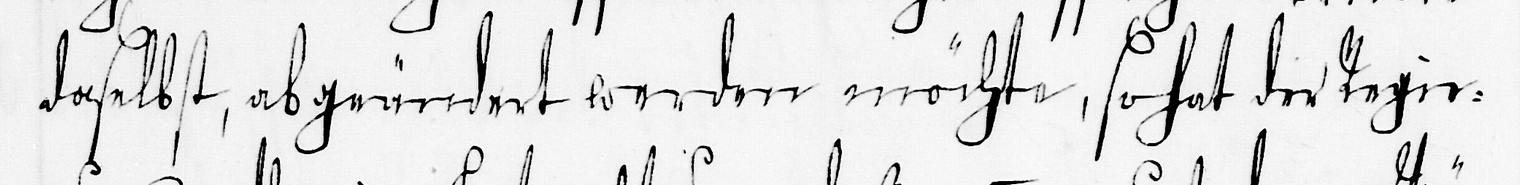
daselbst, abgeändert werden möchte, so hat der Regie¬
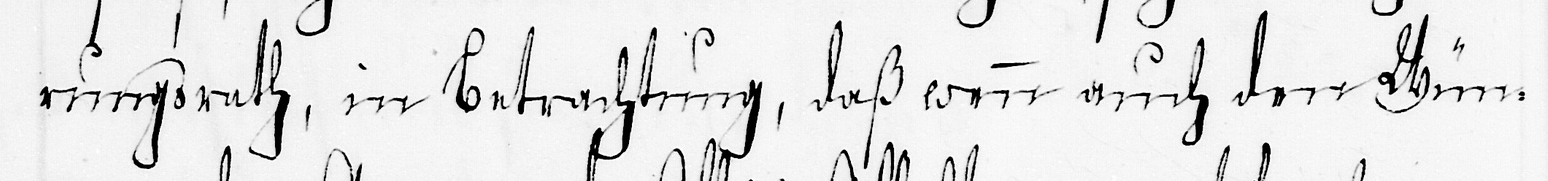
rungsrath, in Betrachtung, daß wenn auch den Wün¬
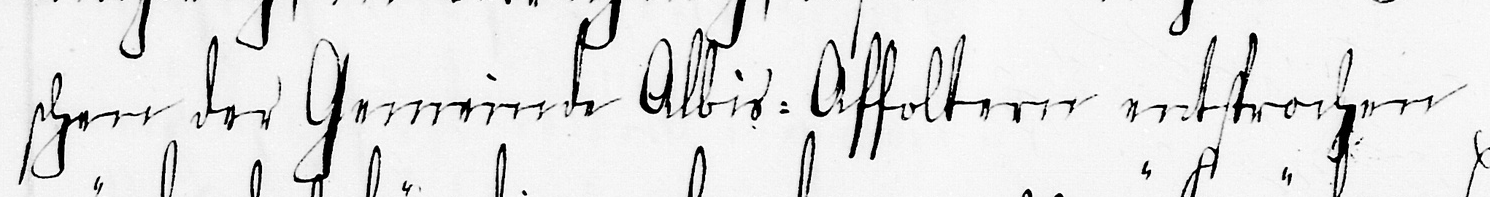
schen der Gemeinde Albis-Affoltern entsprochen
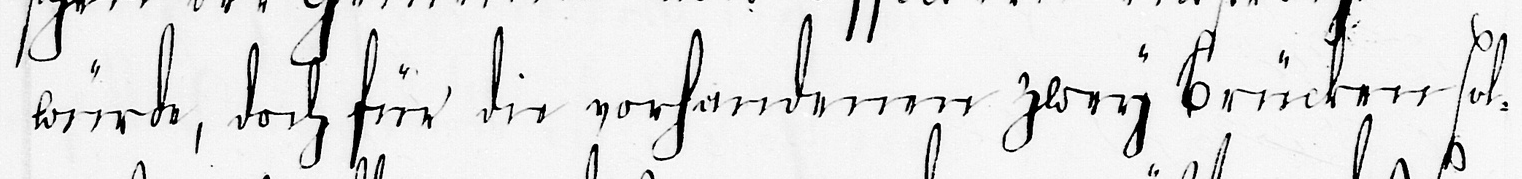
würde, doch für die vorhandenen zwey Brücken sol¬
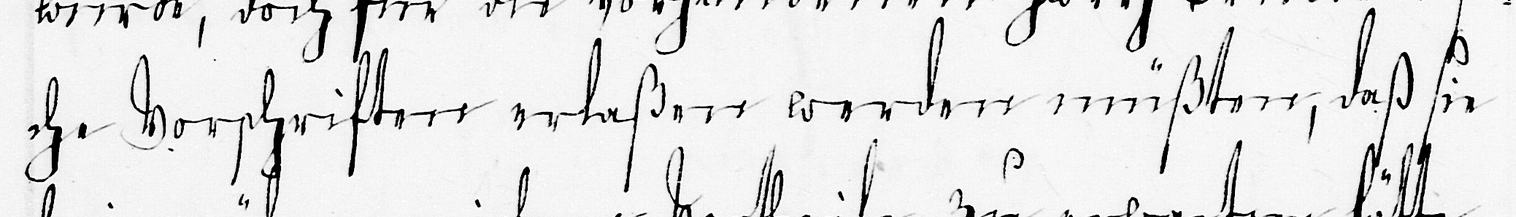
che Vorschriften erlaßen werden müßten, daß sie
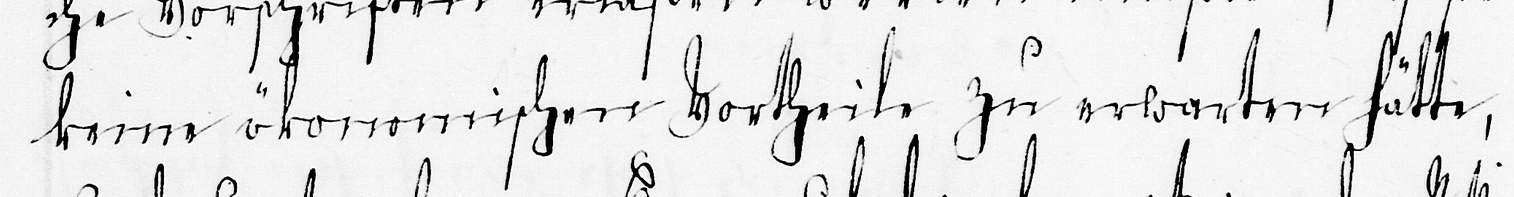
keine ökonomischen Vortheile zu erwarten hätte,
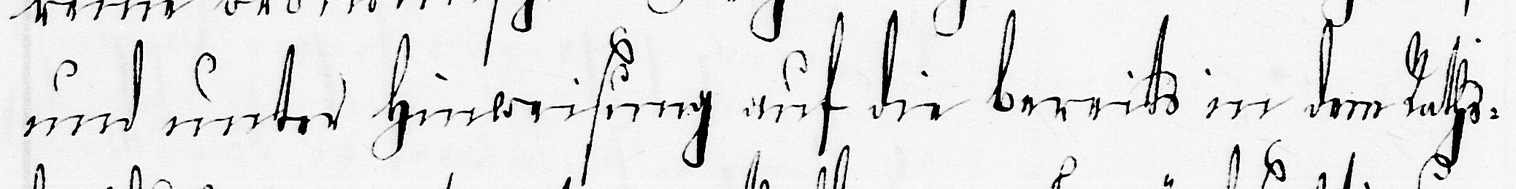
und unter Hinweisung auf die bereits in dem Raths¬
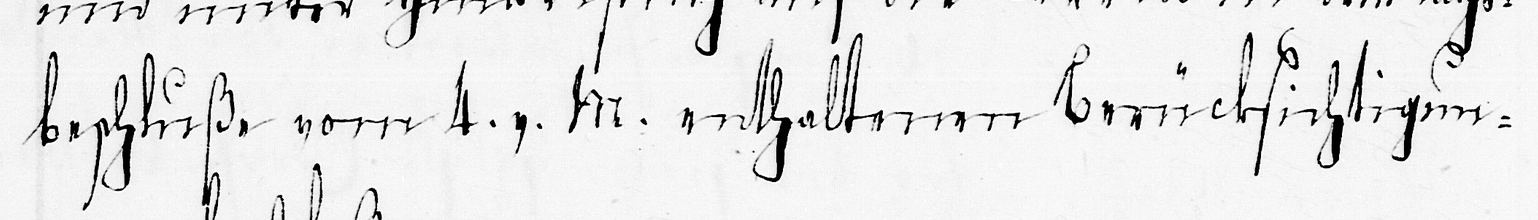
beschluße vom 4. v. M. enthaltenen Berücksichtigun¬
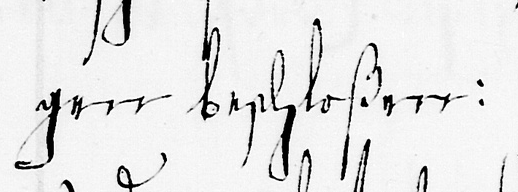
gen beschloßen:
